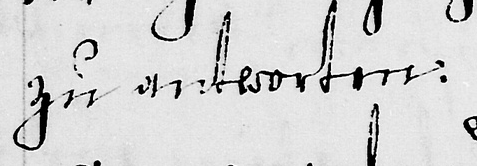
zu antworten:
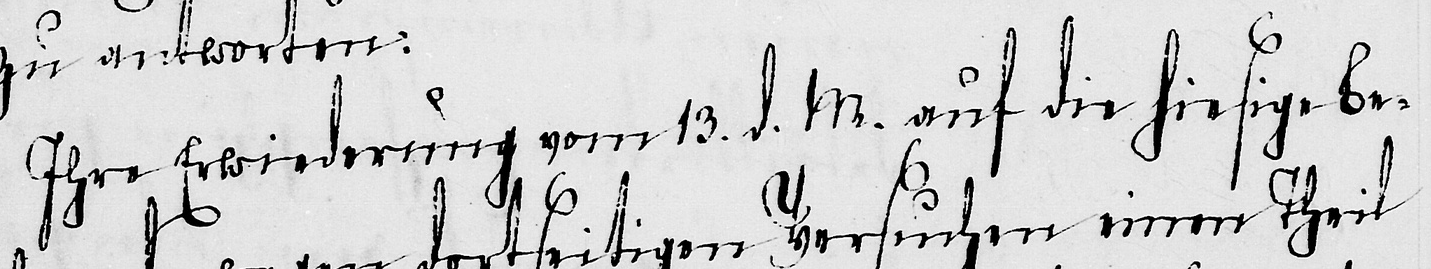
Ihre Erwiederung vom 13. d. M. auf die hiesige Be¬
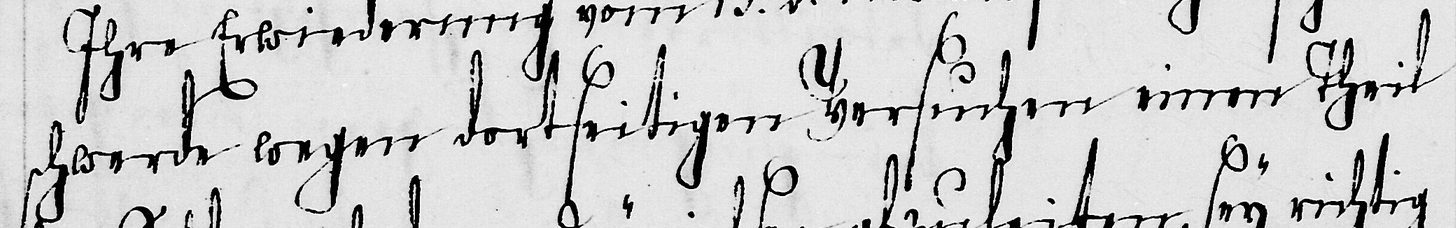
schwerde wegen dortseitigen Versuchen einen Theil
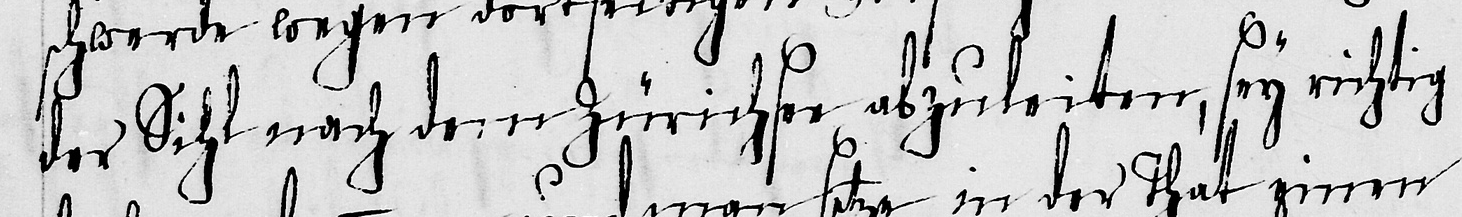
der Sihl nach dem Zürichsee abzuleiten, sey richtig
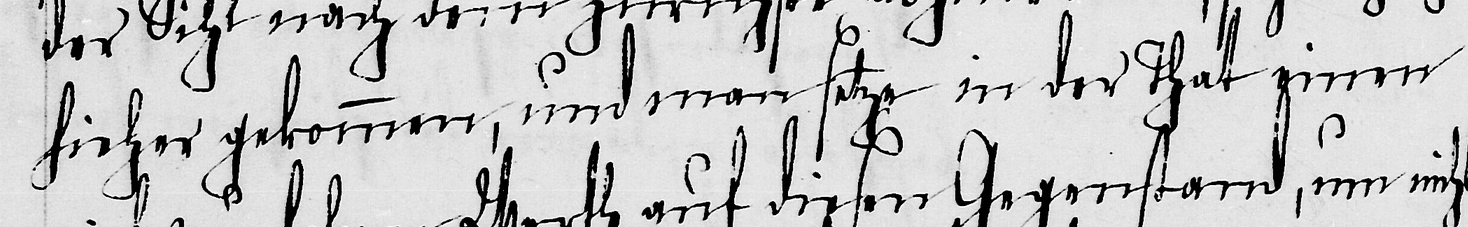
hieher gekommen, und man setze in der That einen
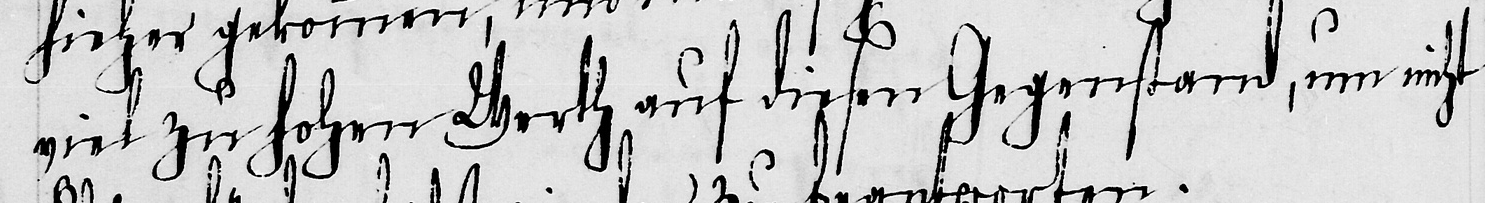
viel zu hohen Werth auf diesen Gegenstand, um nic¬
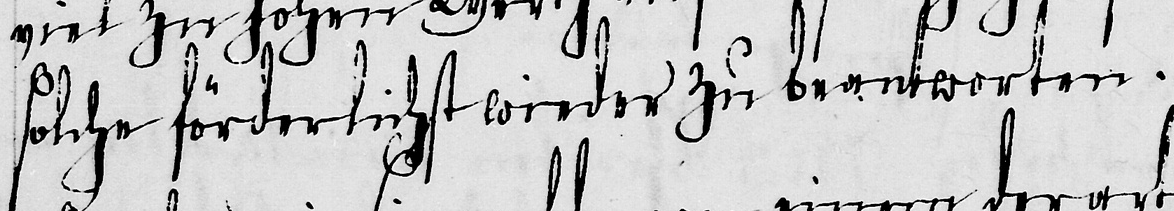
solche förderlichst wieder zu beantworten.
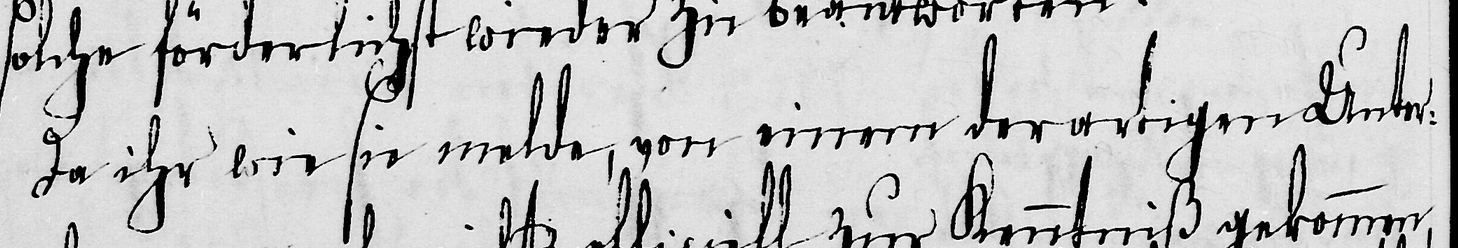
Da ihr wie sie melde, von einem derartigen Unter¬
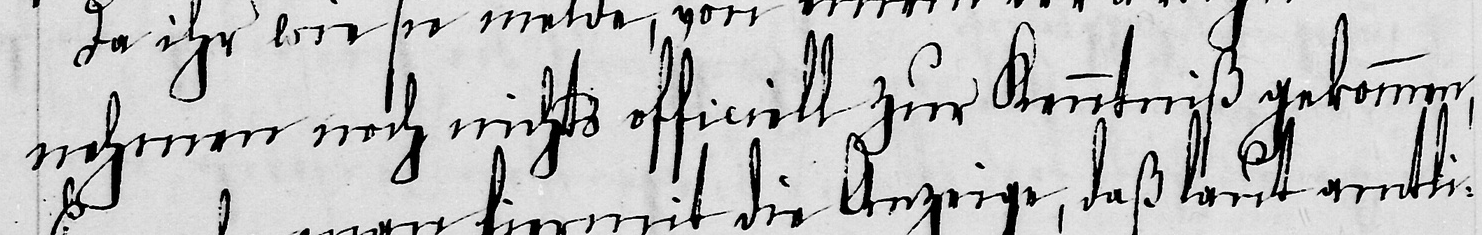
nehmen noch nichts officiell zur Kenntniß gekomme¬
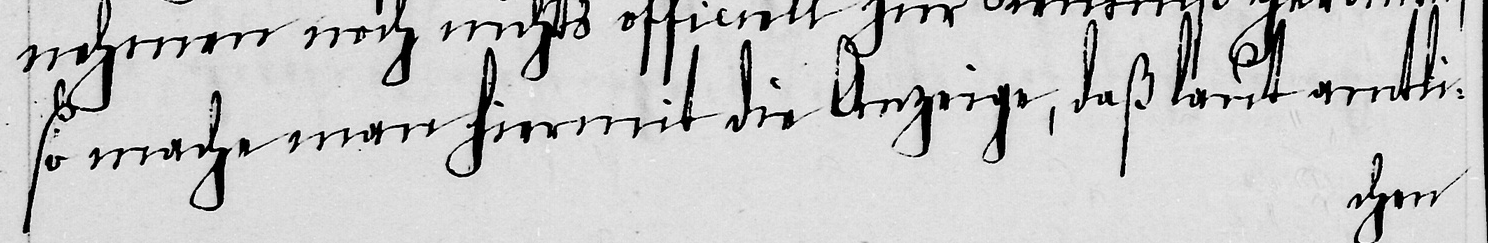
so mache man hiermit die Anzeige, daß laut amtli-
